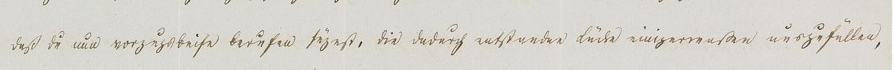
daß Du nun vorzugsweise berufen seyest, die dadurch entstandne Lücke einigermaßen auszufüllen,
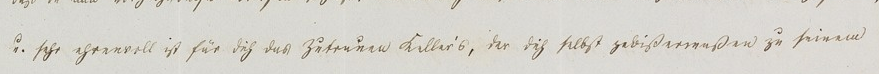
u. sehr ehrenvoll ist für Dich das Zutrauen Keller's, der Dich selbst gewissermaßen zu seinem
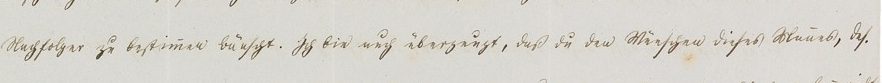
Nachfolger zu bestimmen wünscht. Ich bin auch überzeugt, daß Du den Wünschen dieses Mannes, des-
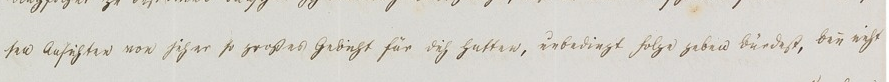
sen Ansichten von jeher so großes Gewicht für Dich hatten, unbedingt Folge geben würdest, wenn nicht
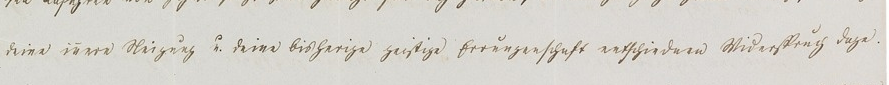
Deine innere Neigung u. Deine bisherige geistige Errungenschaft entschiednen Widerspruch dage-
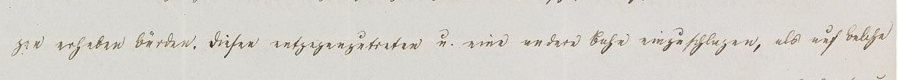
gen erheben würden. Diesen entgegenzutreten u. eine andere Bahn einzuschlagen, als auf welche
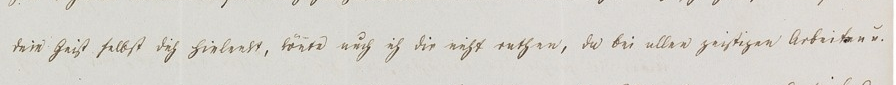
Dein Geist selbst Dich hinlenkt, könnte auch ich Dir nicht rathen, da bei allen geistigen Arbeiten u.
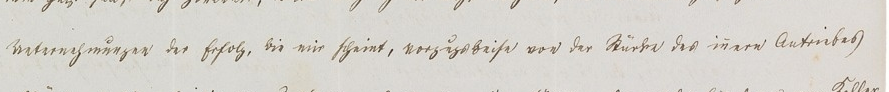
Unternehmungen der Erfolg, wie mir scheint, vorzugsweise von der Stärke des innern Antriebes
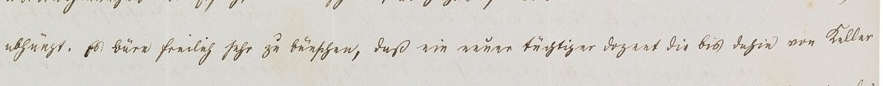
abhängt. Es wäre freilich sehr zu wünschen, daß ein neuer tüchtiger Dozent die bis dahin von Keller
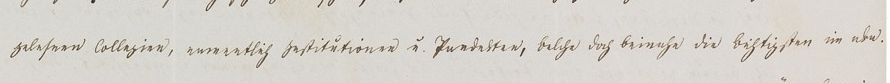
gelesnen Collegien, namentlich Institutionen u. Pandekten, welche doch beinahe die wichtigsten im aka-
